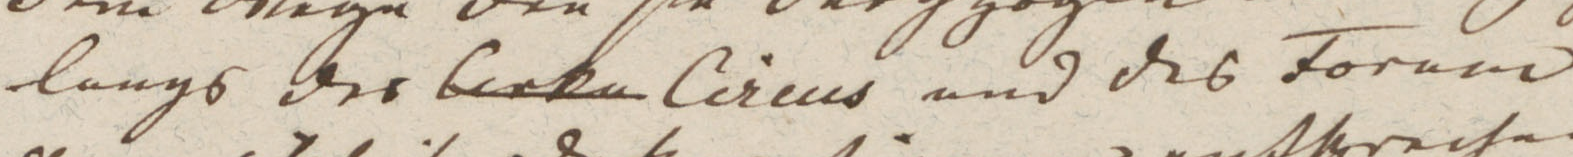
langs ders Cirku Circus und des Forum
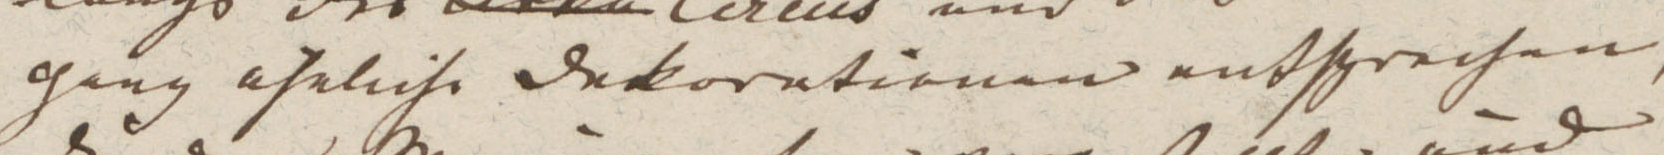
ganz ähnliche Dekorationen entsprechen,
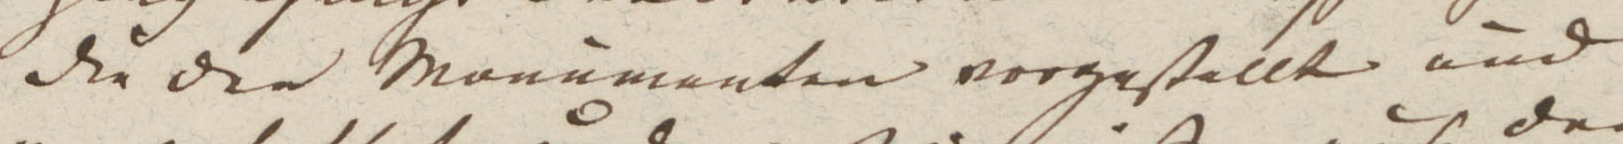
die den Monumenten vorgestellt und
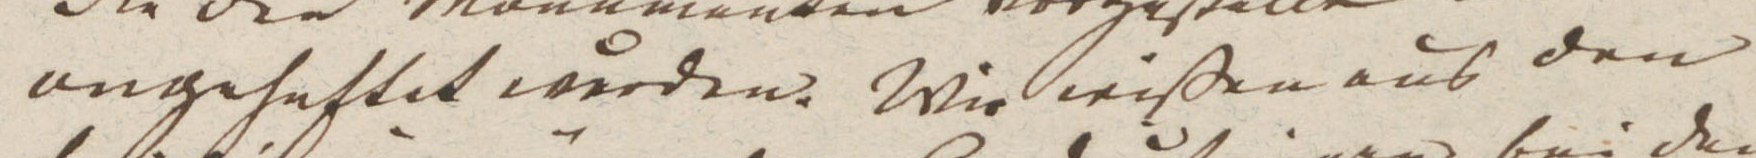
angeheftet wurden. Wir wissen aus den
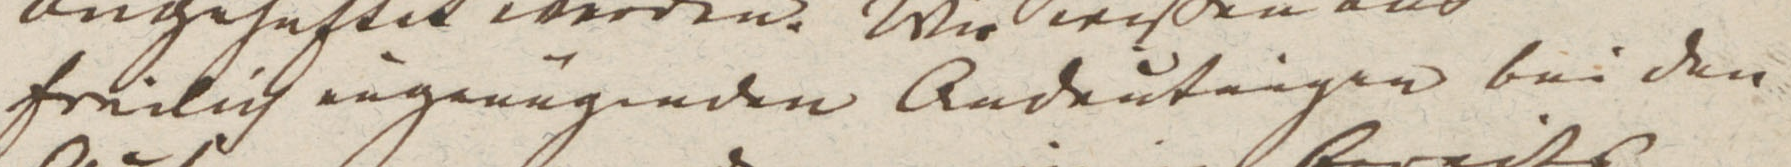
freilich ungenügenden Andeutungen bei den
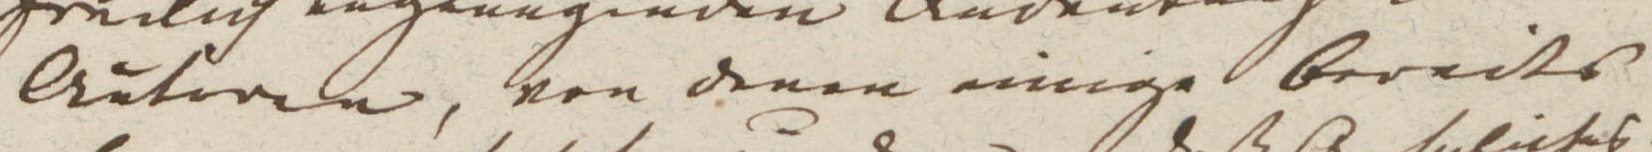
Autoren, von denen einige bereits
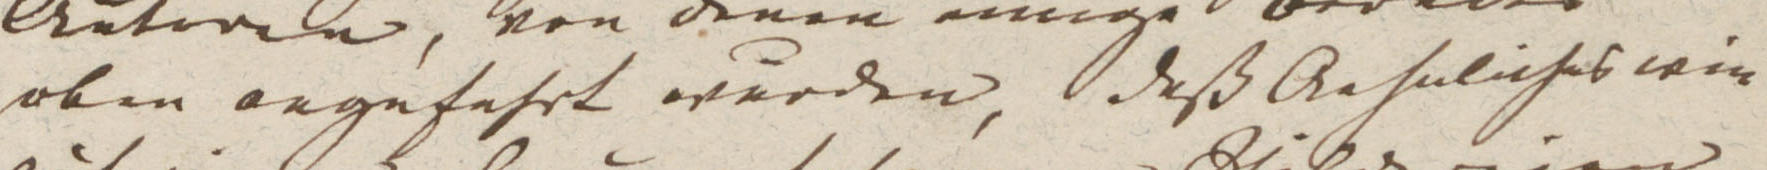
oben angefuhrt wurden, dass Aehnliches wie
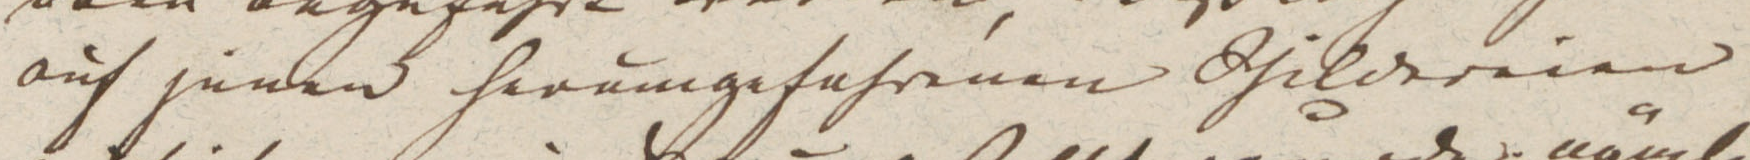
auf jenen herumgefahrenen Schildereien
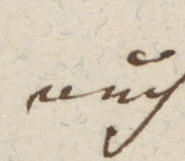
auch
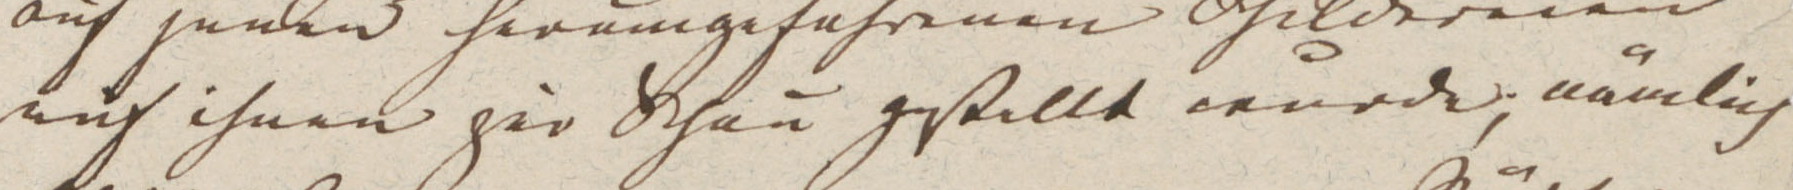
auf ihnen zur Schau gestellt wurde; nämlich
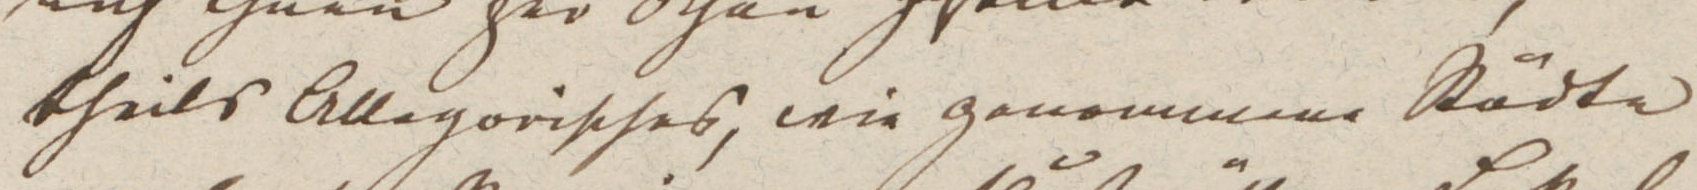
theils Allegorisches, wie genommene Städte
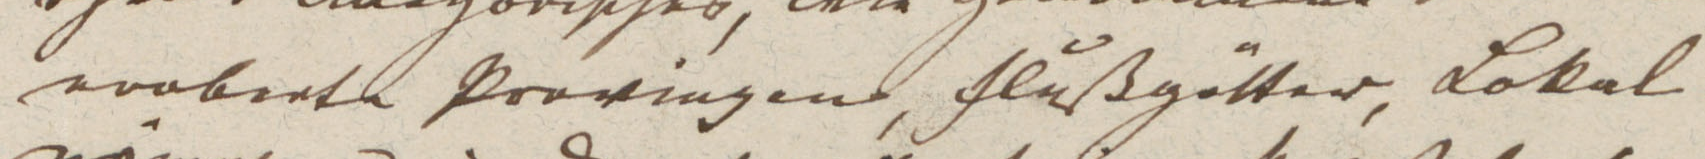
eroberte Provinzen, Flussgötter, Lokal-
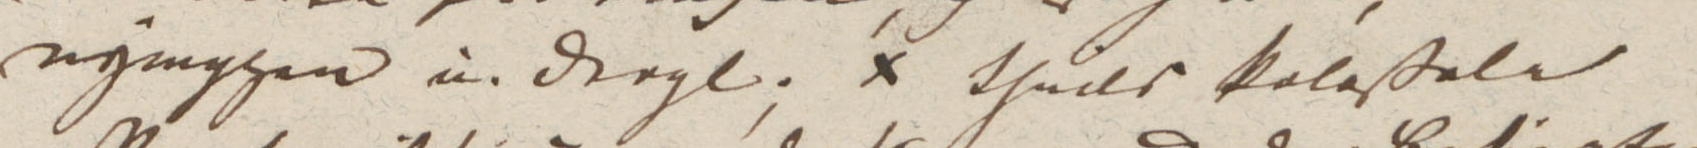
nymphen u. dergl; % theils kolossale
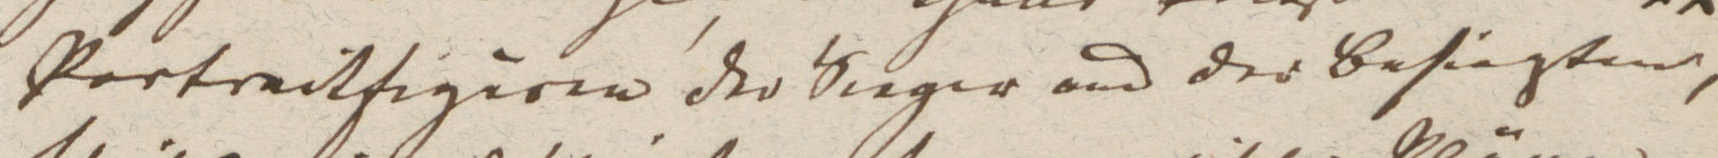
Portraitfiguren der Sieger und der Besiegten, %
